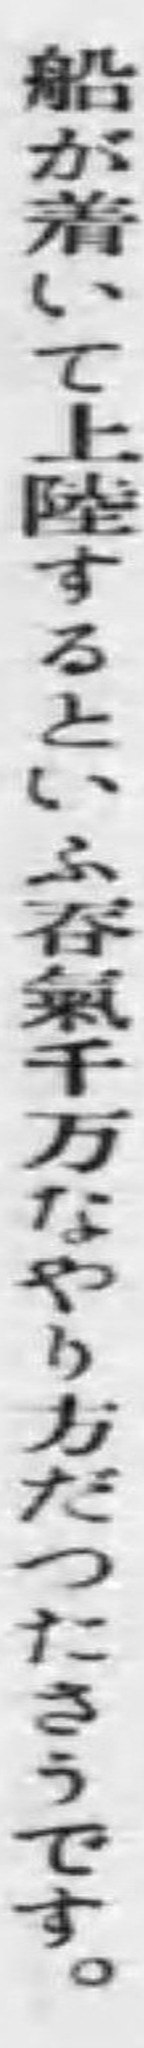船が着いて上陸するといふ呑気千万なやり方だつたさうです。
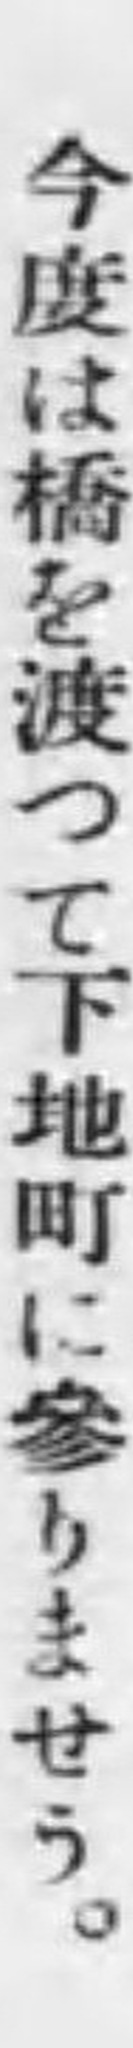今度は橋を渡つて下地町に参りませう。
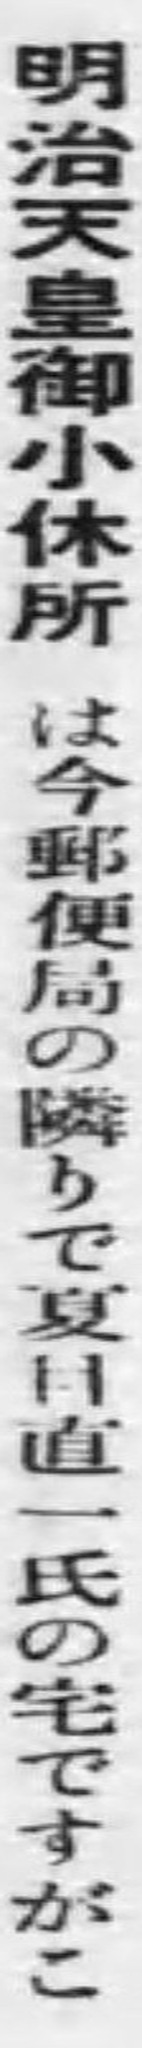明治天皇御小休所は今郵便局の隣りで夏目直一氏の宅ですがこ
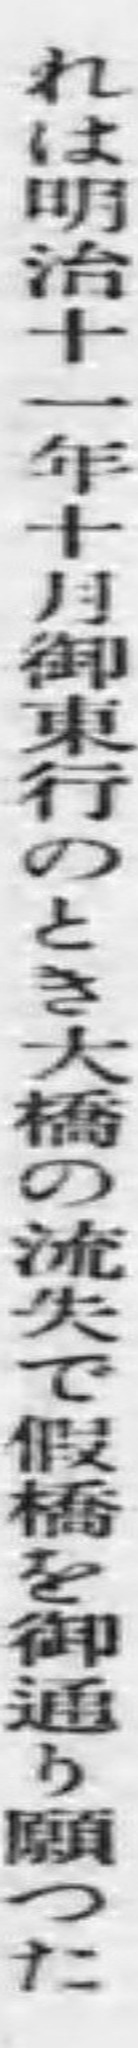れは明治十一年十月御東行のとき大橋の流失で仮橋を御通り願つた
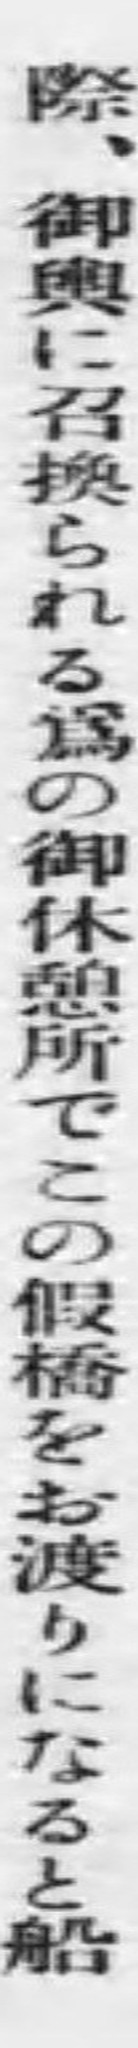際、御輿に召換られる為の御休憩所でこの仮橋をお渡りになると船
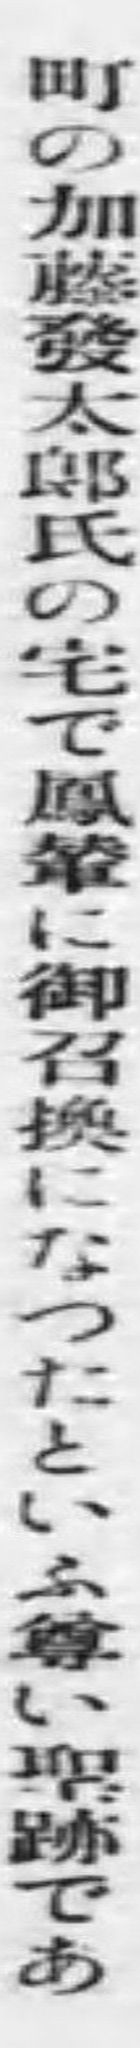町の加藤発太郎氏の宅で鳳輦に御召換になつたといふ尊い聖跡であ
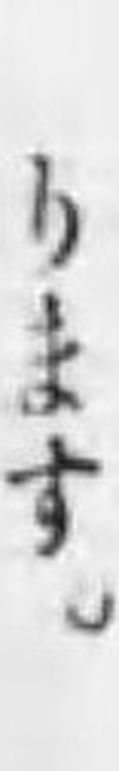ります。
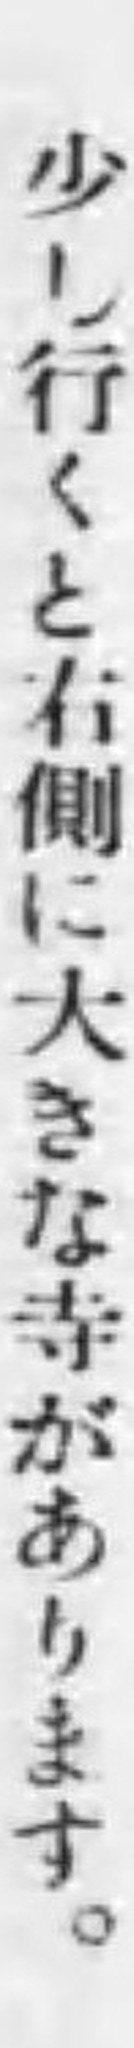少し行くと右側に大きな寺があります。
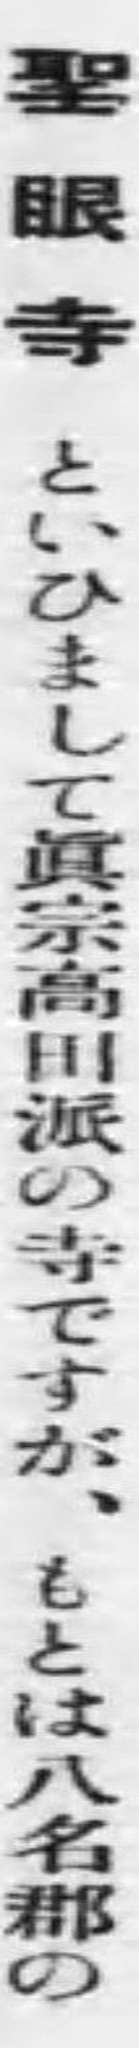聖眼寺といひまして真宗高田派の寺ですが、もとは八名郡の
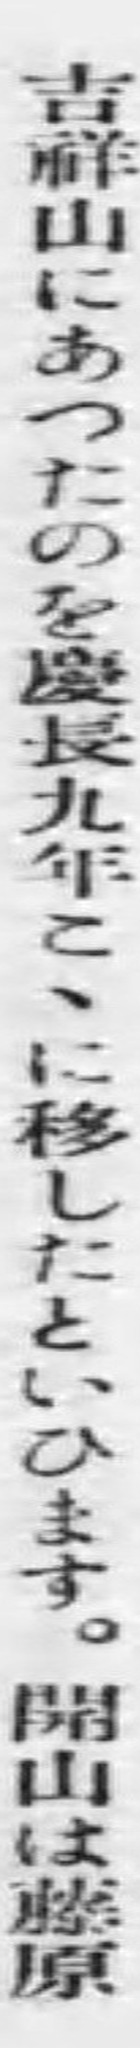吉祥山にあつたのを慶長九年こゝに移したといひます。開山は藤原

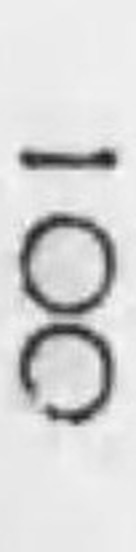一〇〇
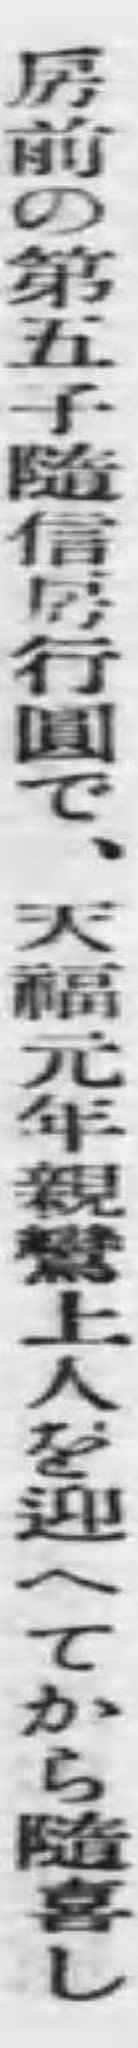房前の第五子随信房行円で、天福元年親鸞上人を迎へてから随喜し
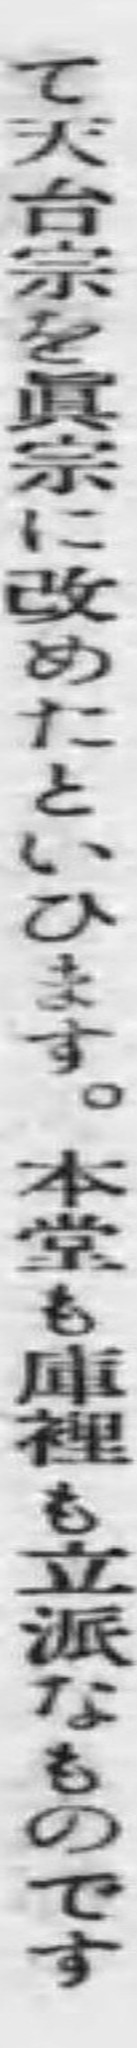て天台宗を真宗に改めたといひます。本堂も庫裡も立派なものです
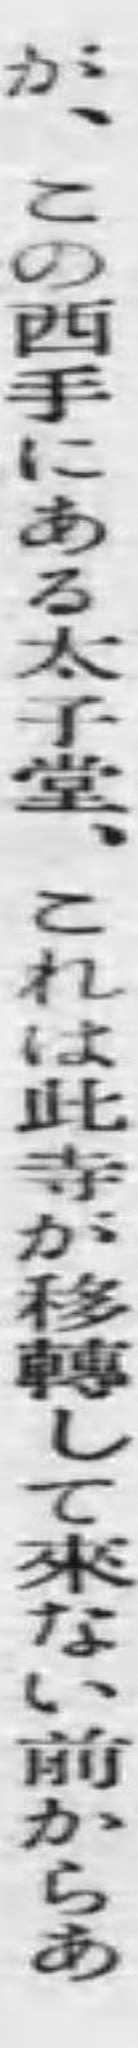が、この西手にある太子堂、これは此寺が移転して来ない前からあ
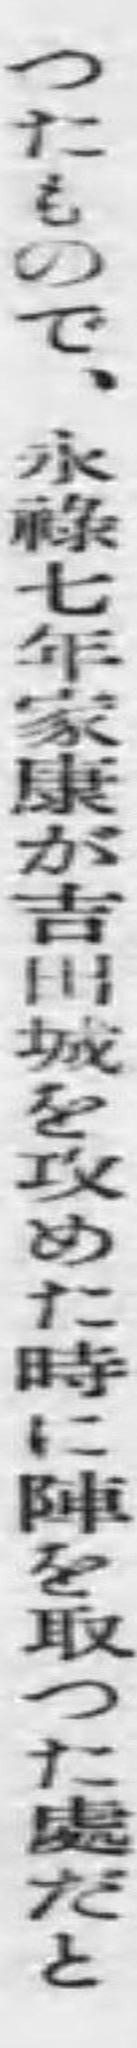つたもので、永禄七年家康が吉田城を攻めた時に陣を取つた処だと
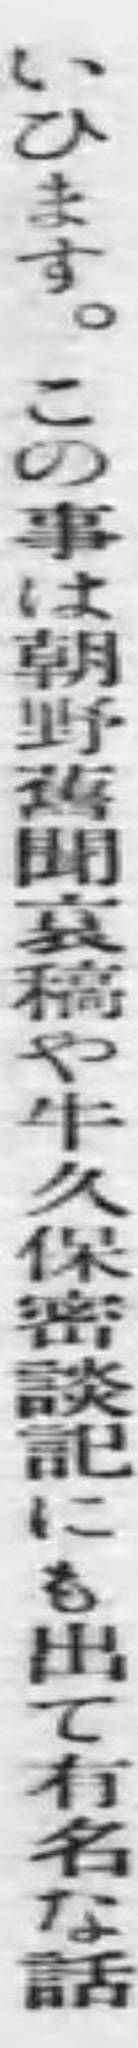いひます。この事は朝野旧聞裒稿や牛久保密談記にも出て有名な話
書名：東三河道中記 : 豊橋市及其附近案内
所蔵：国立国会図書館 National Diet Library, JAPAN
